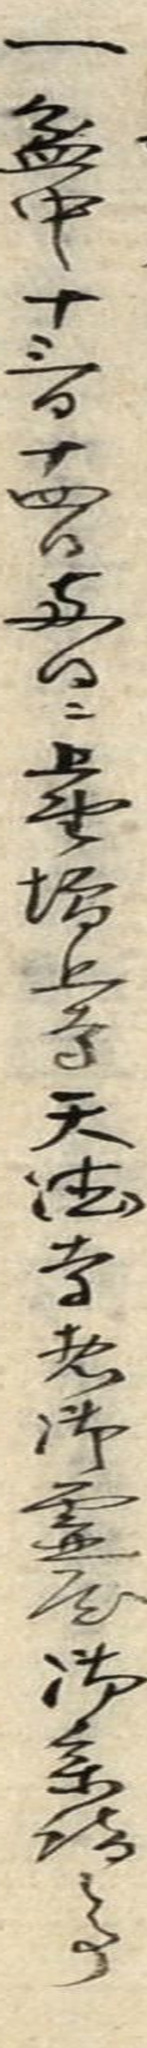一盆中十三日十四日両日に上野増上寺天徳寺惣御霊屋御参詣之事
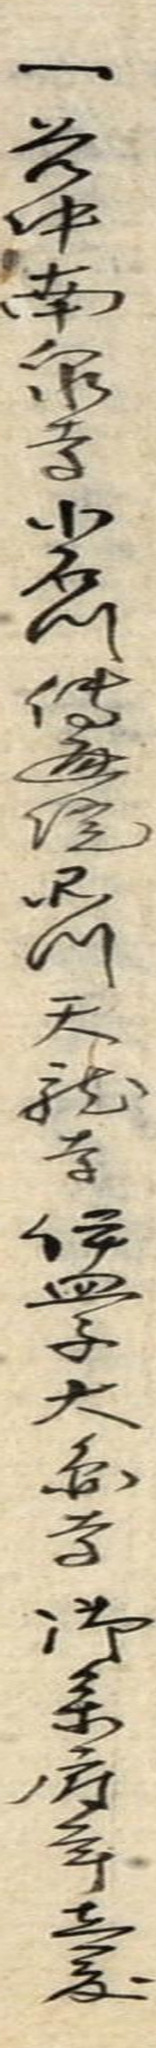一谷中南泉寺小石川伝通院品川天龍寺伊皿子大円寺御参府年壱度
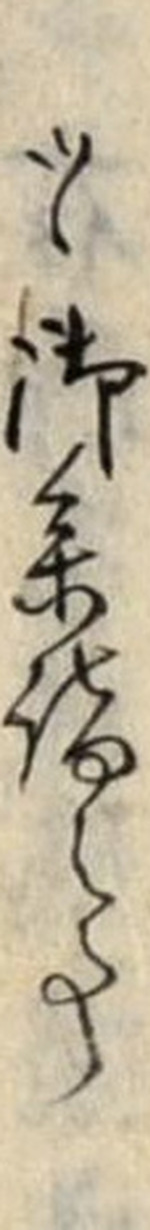ツヽ御参詣之事
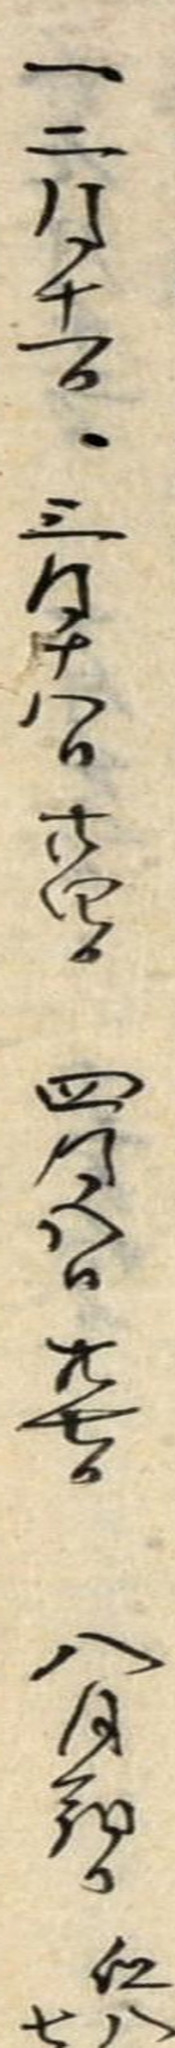一二月十一日三月十八日廿四日四月八日廿七日八月朔日

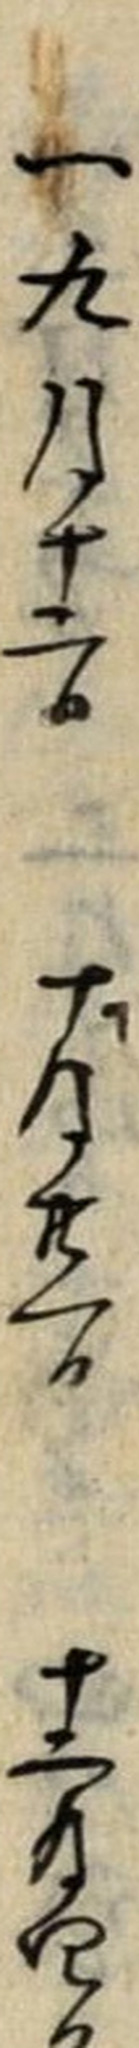一九月十二日十月廿一日十二月四日
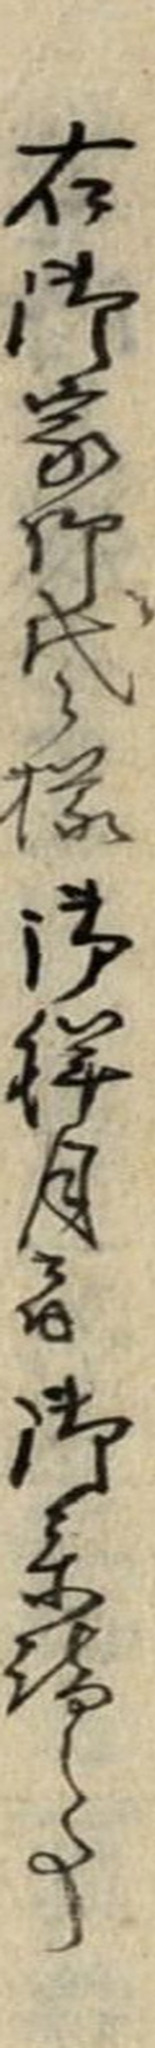右御家御代々様御祥月に付御参詣之事
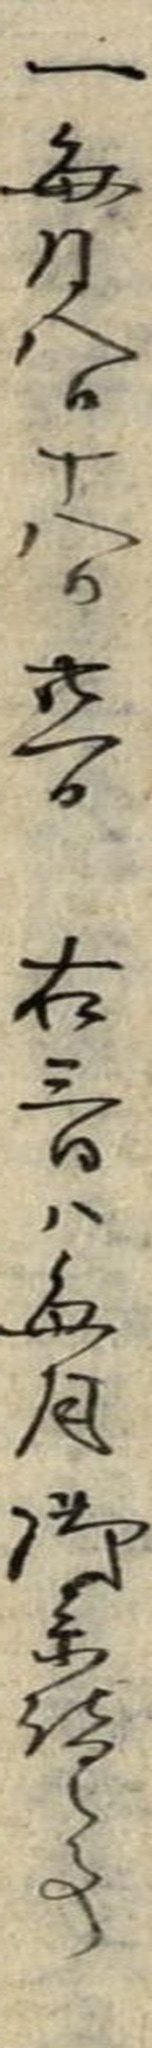一毎月八日十八日廿一日右三日は毎月御参詣之事
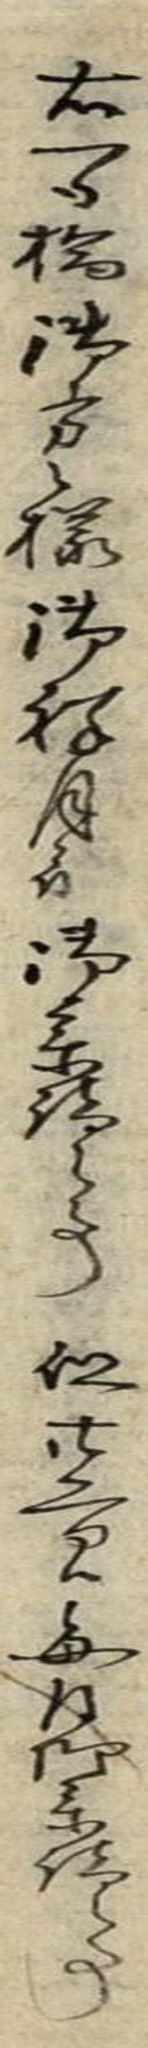右一ツ橋御方々様御祥月に付御参詣之事但廿二日は毎月御参詣之事
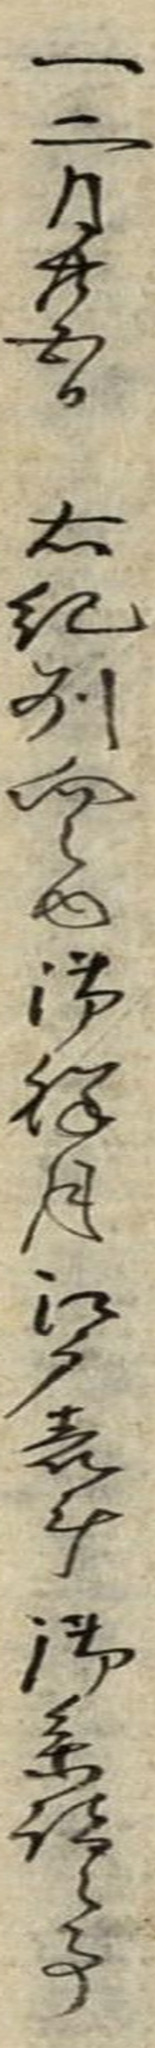一二月廿五日右紀州向之内御祥月江戸表計御参詣之事
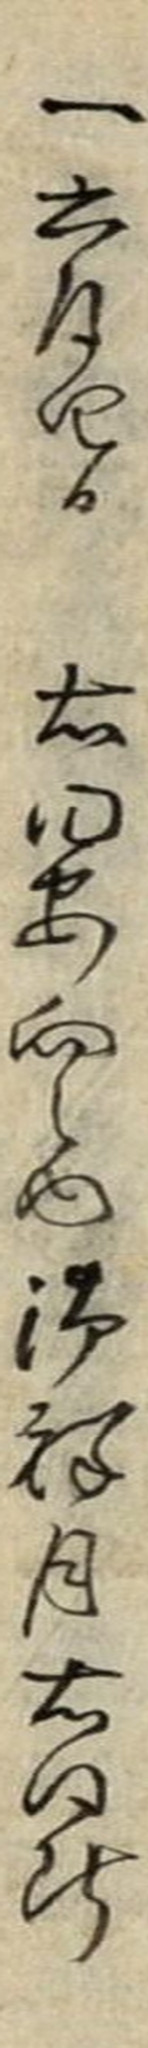一六月四日右田安向之内御祥月右同断
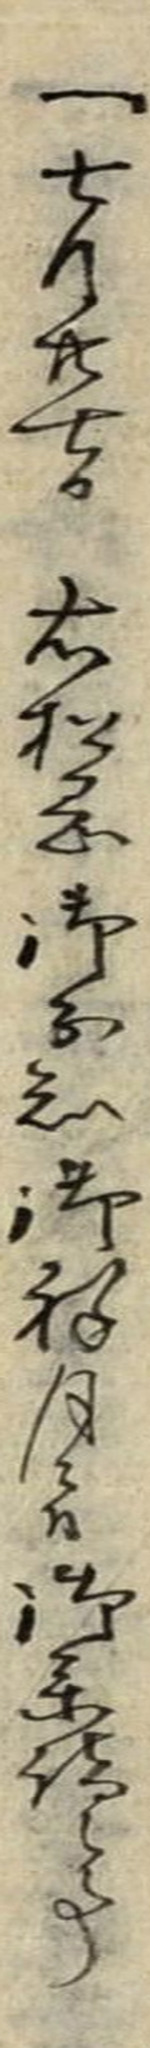一七月廿七日右松岡御分知御祥月に付御参詣之事
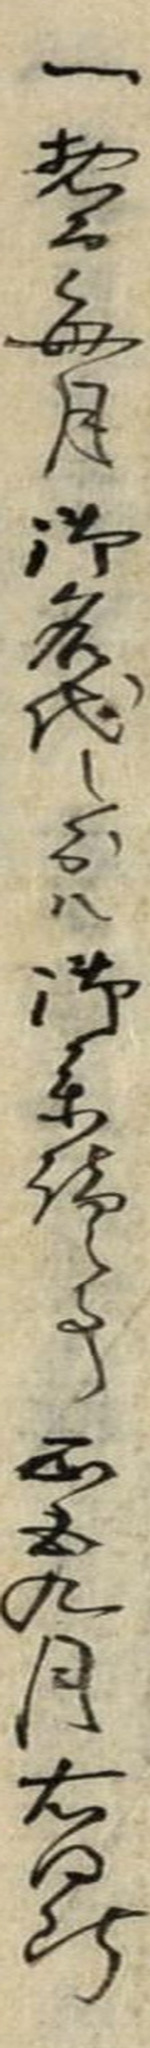一惣て毎月御名代之分は御参詣之事正五九月右同断
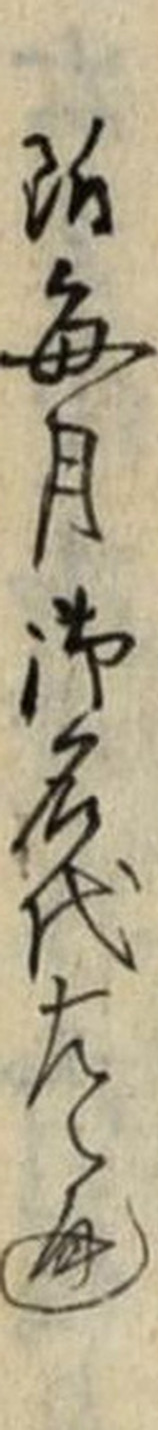附毎月御名代左之通
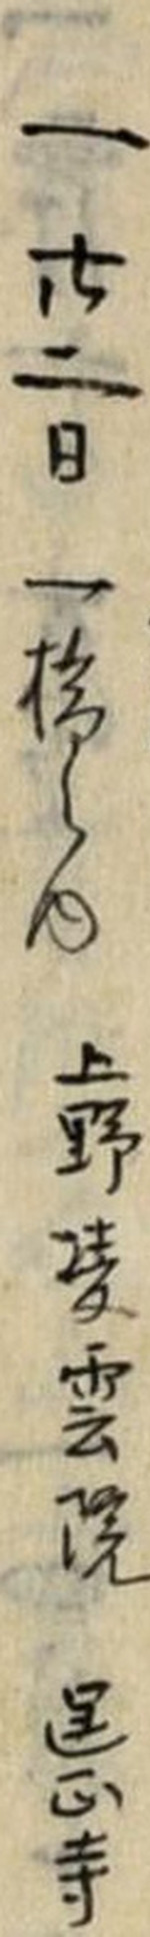一廿二日一橋之内上野陵雲院運正寺
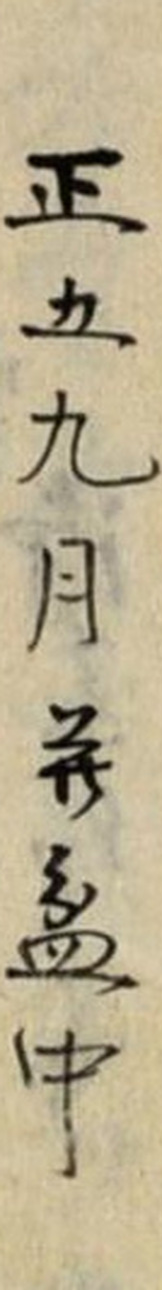正五九月并盆中
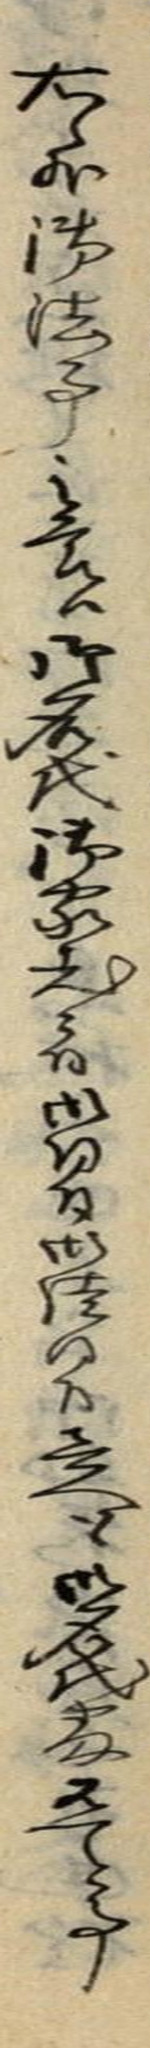右之外御法事之節は御名代御家老に付御目付御徒目付壱人ツヽ御名代番有之候事
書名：三都并道中之部
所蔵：福井県文書館 Fukui Prefectural Archives
